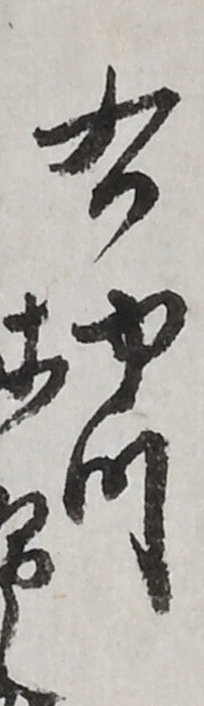右中町
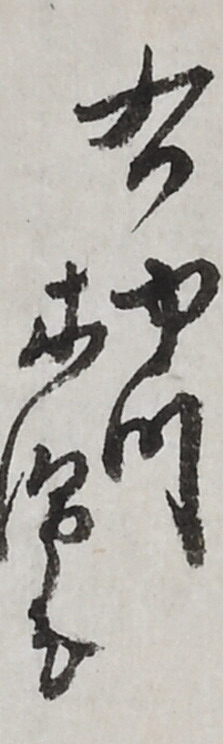右中町
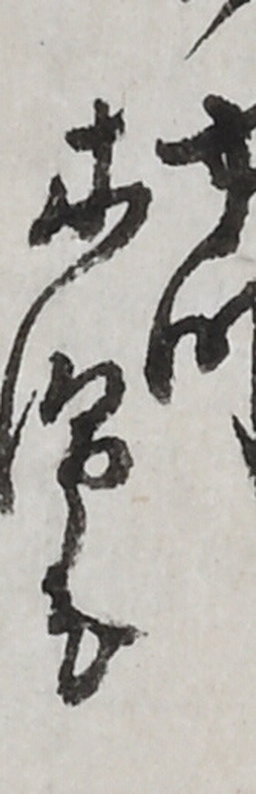木綿屋
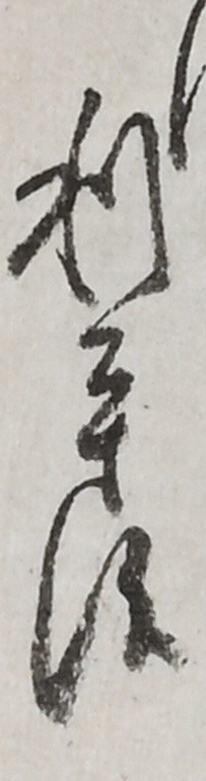利平治
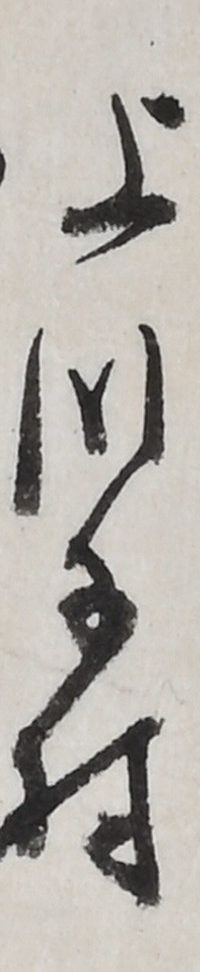上川手村
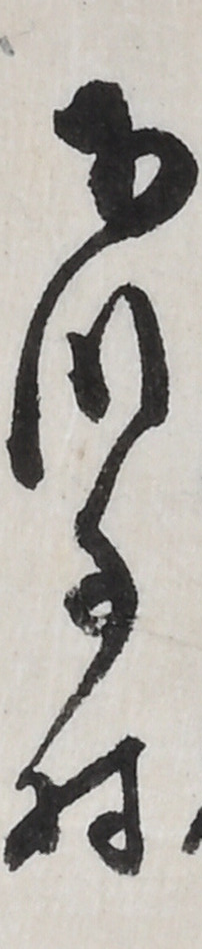下川手村
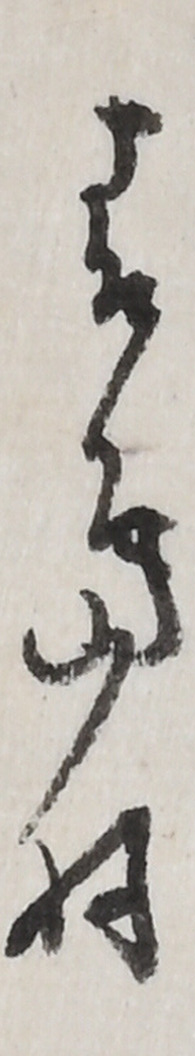青島村
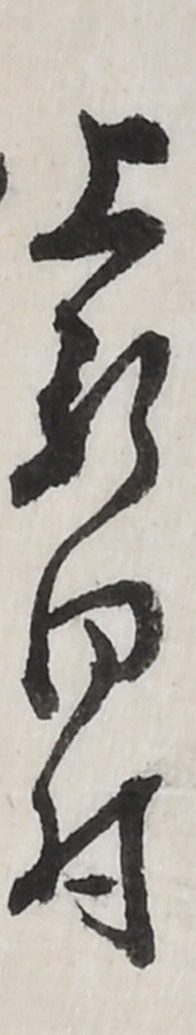上新田村
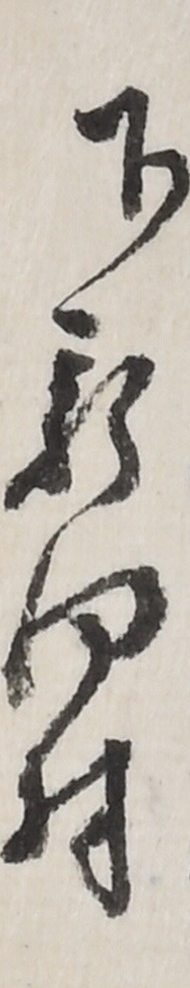下新田村
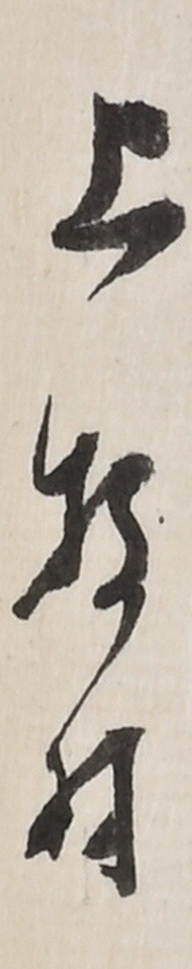上牧村
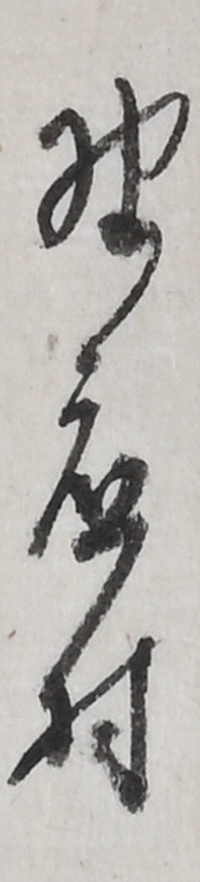野底村
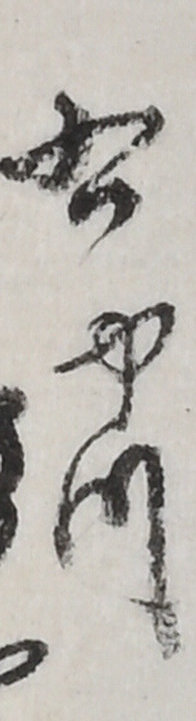右中町
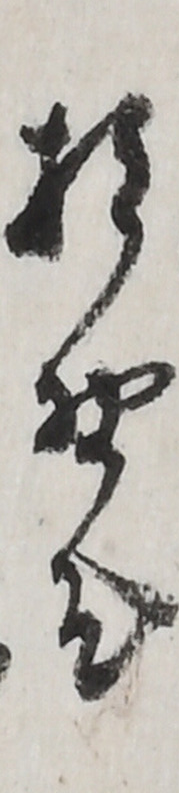杉野屋
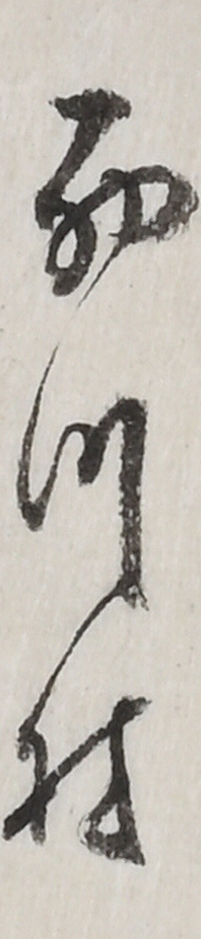西町村
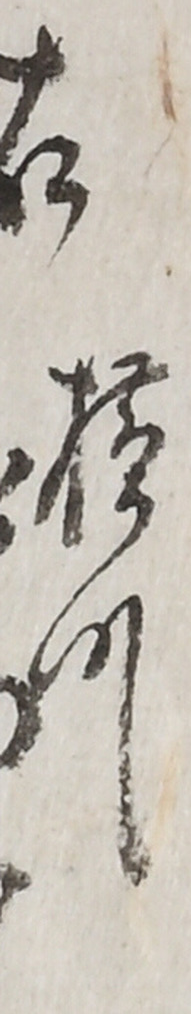右横町
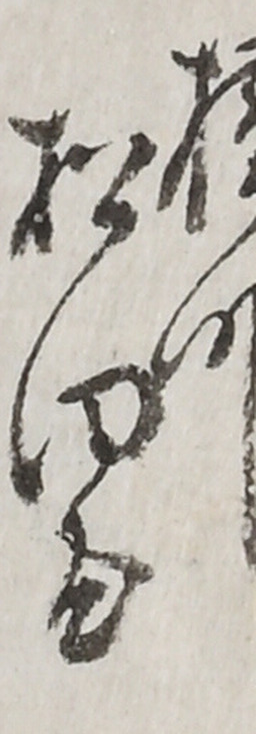松田屋
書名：年内行事帳
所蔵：伊那市立高遠町図書館・合同会社AMANE
